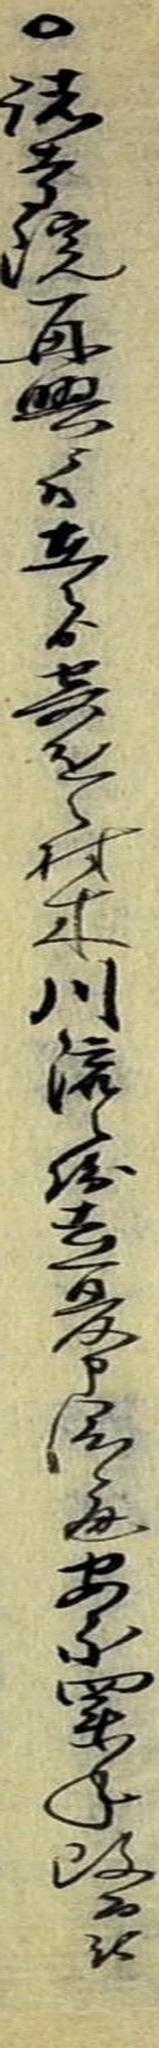〇諸寺院再興ニ付在々ゟ寄進之材木川流候儀去夏申渡候通安永四未年改而被
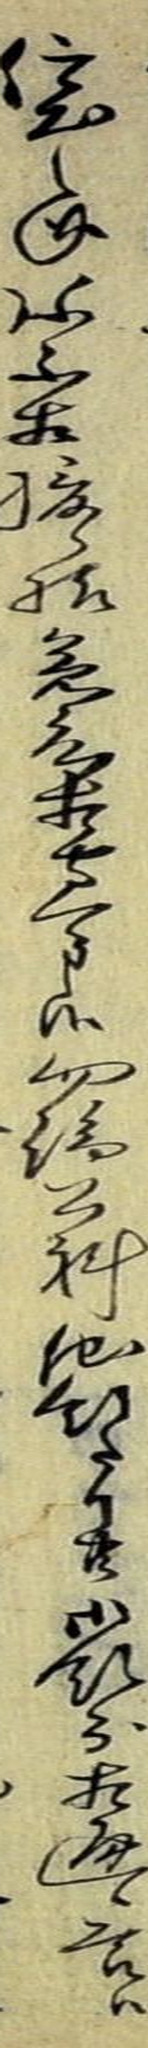仰出之趣弥不相緩候様急度相守可申候勿論公料他領たり共御領分相通候節ハ
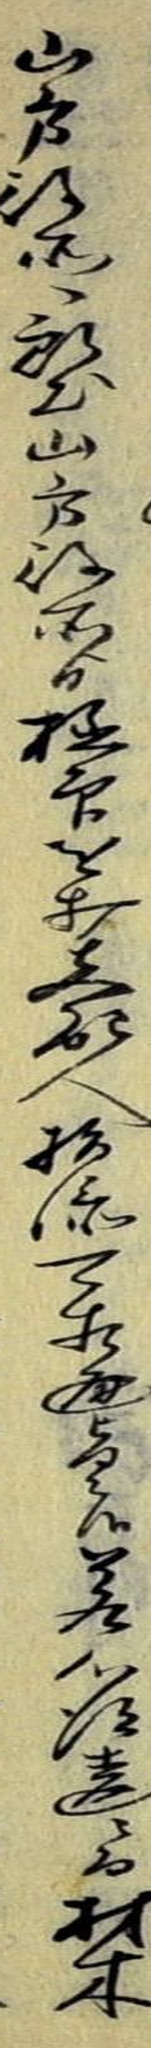山方役所へ願出山方役所ゟ極印を打支配人指添可相通旨ニ候若心得違ニ而材木
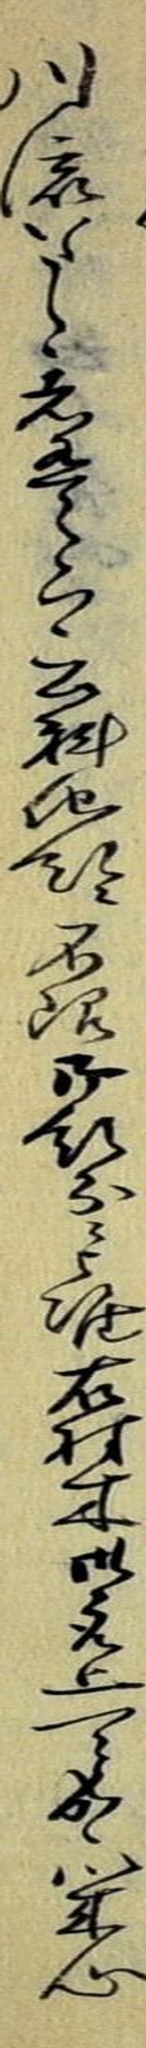川流いたし候者有之候ハヽ公料他領ニ不限御領分ニ被准右材木御取上可被成候以来心
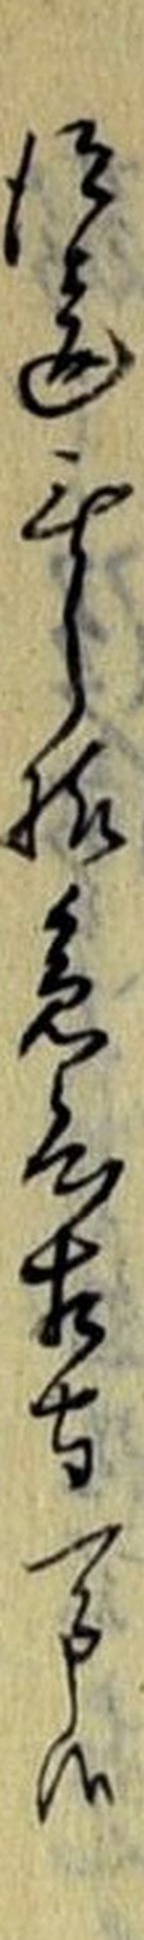得違無之様急度相守可申候
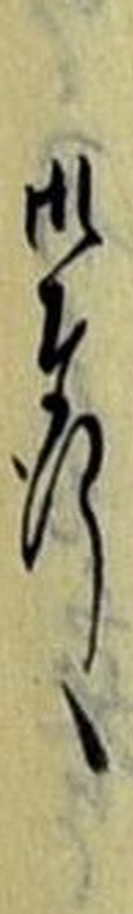御奉行へ
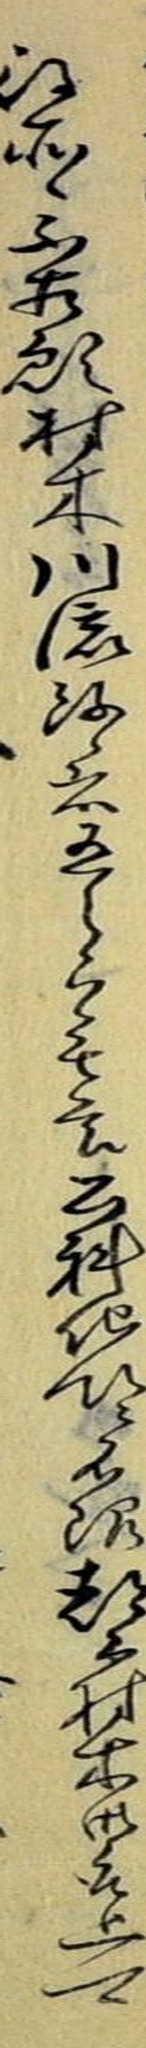役所へ不相願材木川流致候者有之候ハヽ其節公料他領ニ不限都而材木御取上可
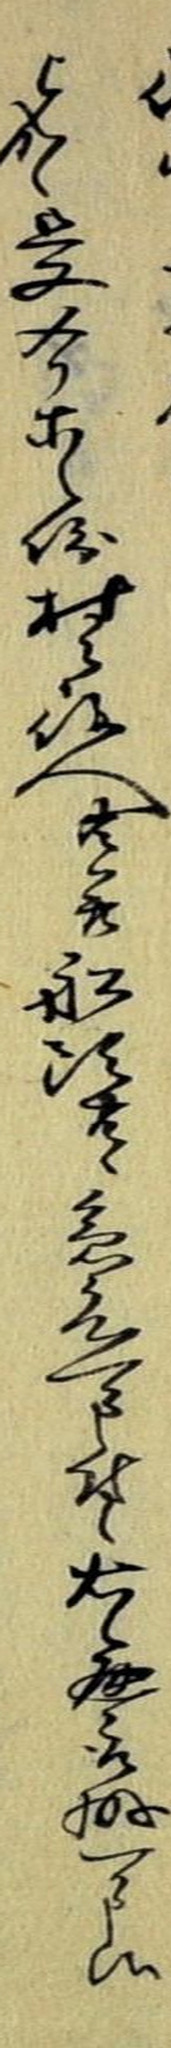被成候且又〆り等之儀村々役人共并船頭共へ急度可申付候右之通取扱可申候
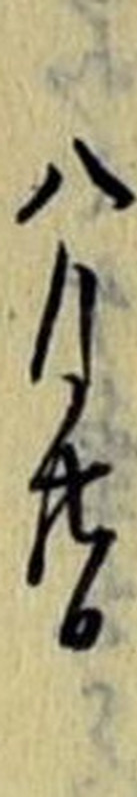八月廿日
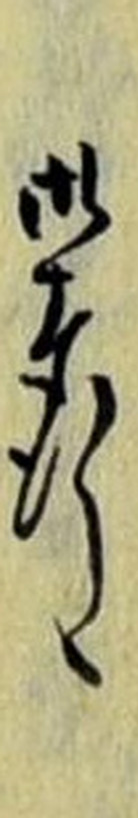御奉行へ
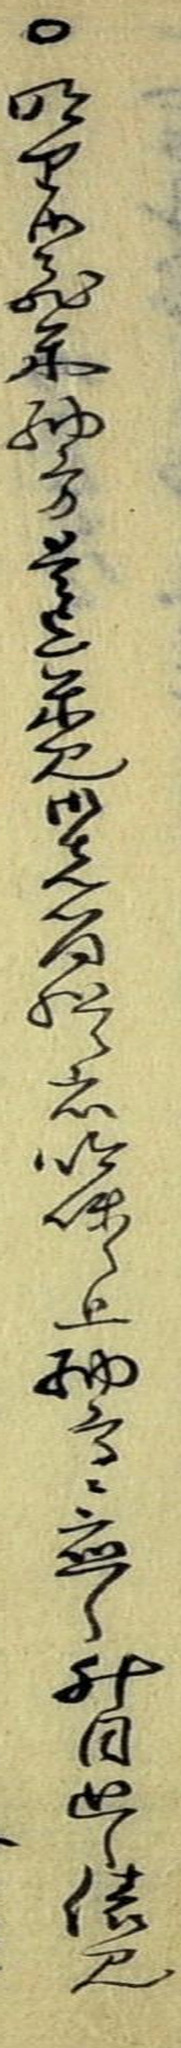〇明里御蔵米納方是迄米見御先筒組之者吟味之上納高ニ応し升目廻し俵見
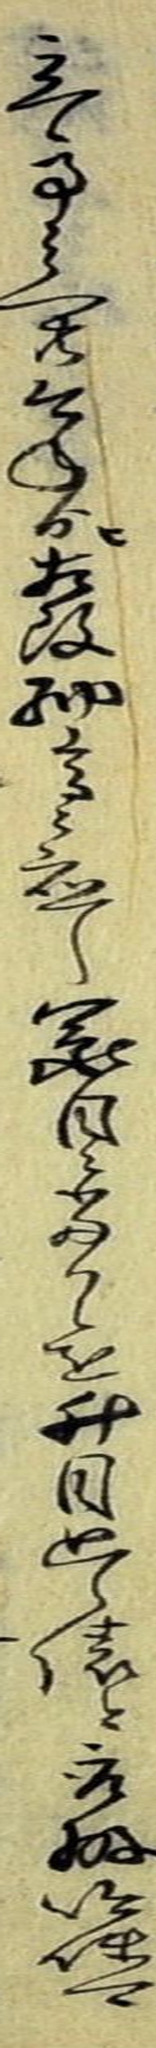立候事ニ候へ共今年ゟ被相改納高ニ応し鬮目ニ当り候を升目廻し俵ニ取扱吟味可
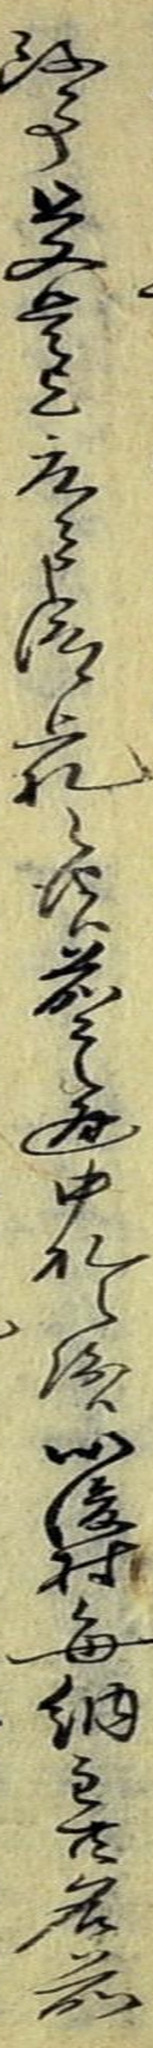致候事且又是迄度々申渡候上札之儀ハ前々之通中札之儀ハ以後村毎納主共名前
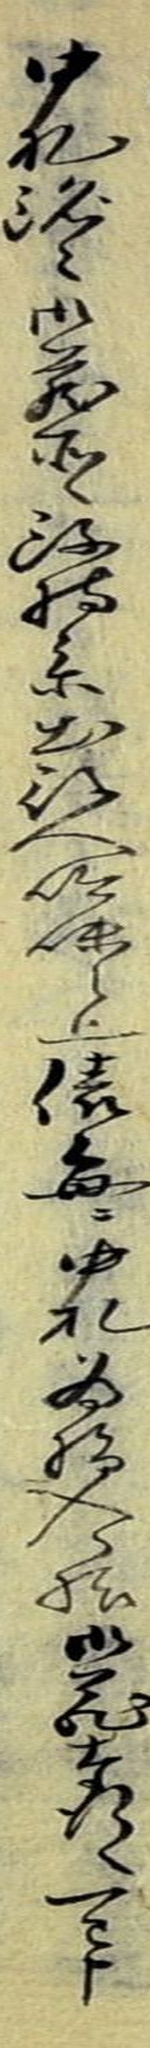中札銘々御蔵所へ致持参出役人吟味之上俵毎ニ中札為指入候様御蔵奉行へ可被申
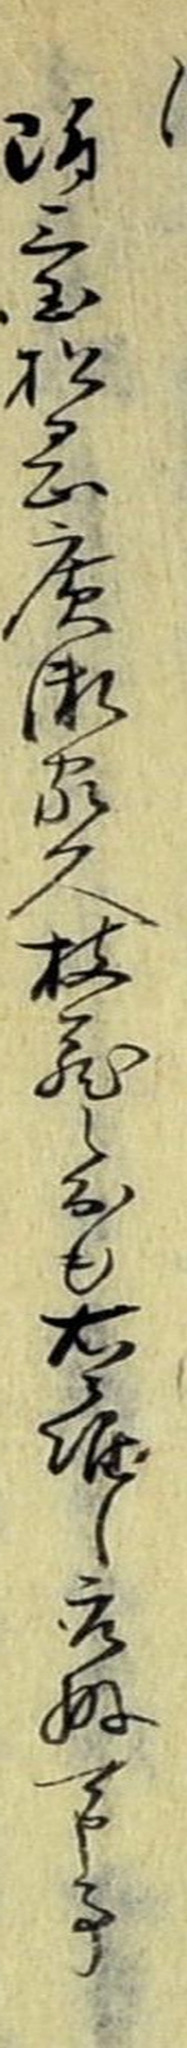附三国松岡広瀬家久枝蔵之分も右ニ准し取扱可申事
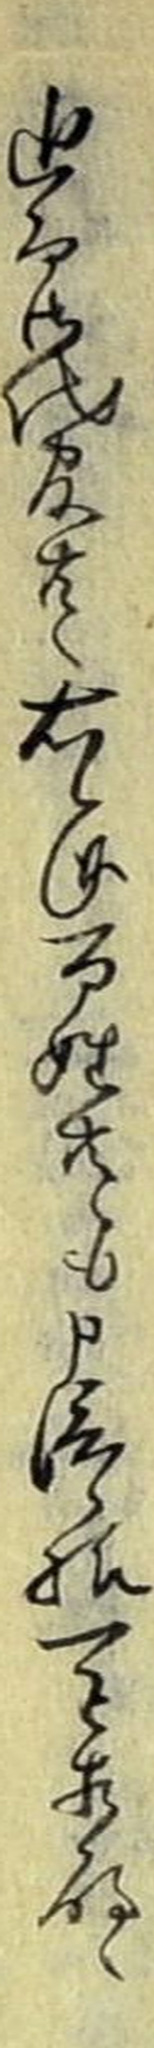追而御代官共へ右之趣百姓共へも申渡候様可被相触候
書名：命令之部 三
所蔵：福井県文書館 Fukui Prefectural Archives
